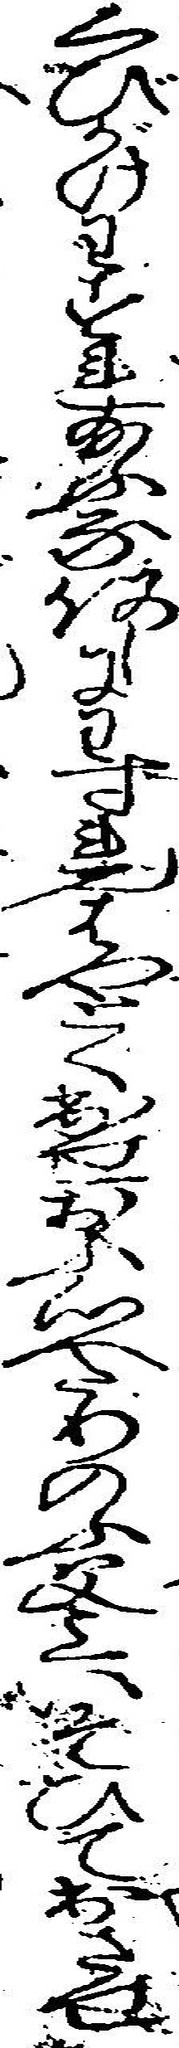くびがけわすれ給ふな何しにわすれんはやとく出せおふ心へたりのふ父上いそひて出させ
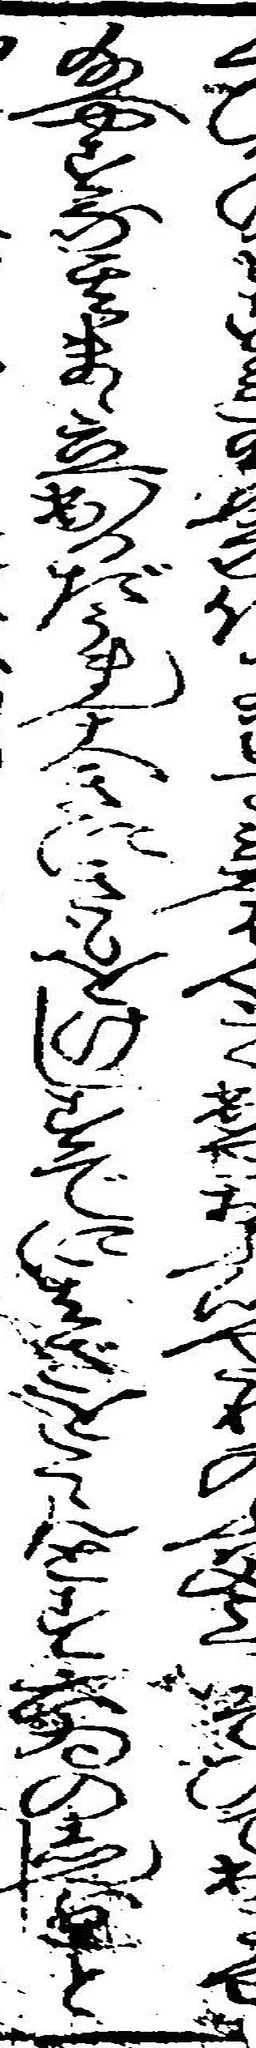給へやすな其まゝ立出るだうまん大きにきもをけしすでに其ざをたゝんとす六ゐのしんはと
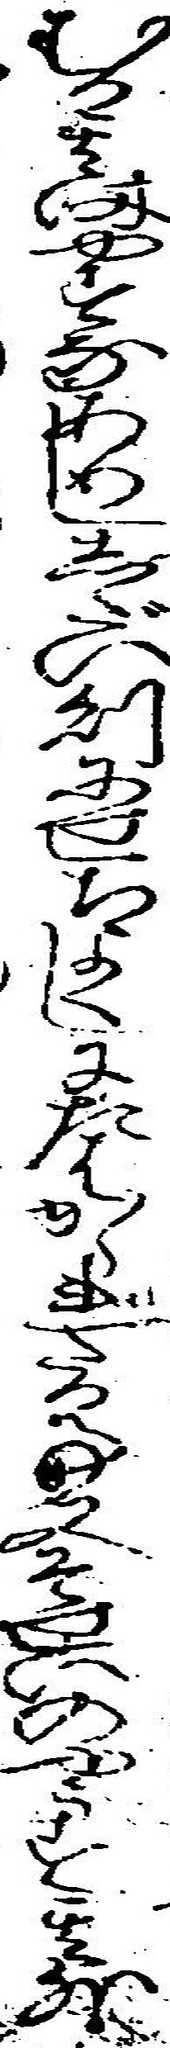むる其時やすなありししだい則にせちよくしにたはかられたる事又そせいのやうす其外
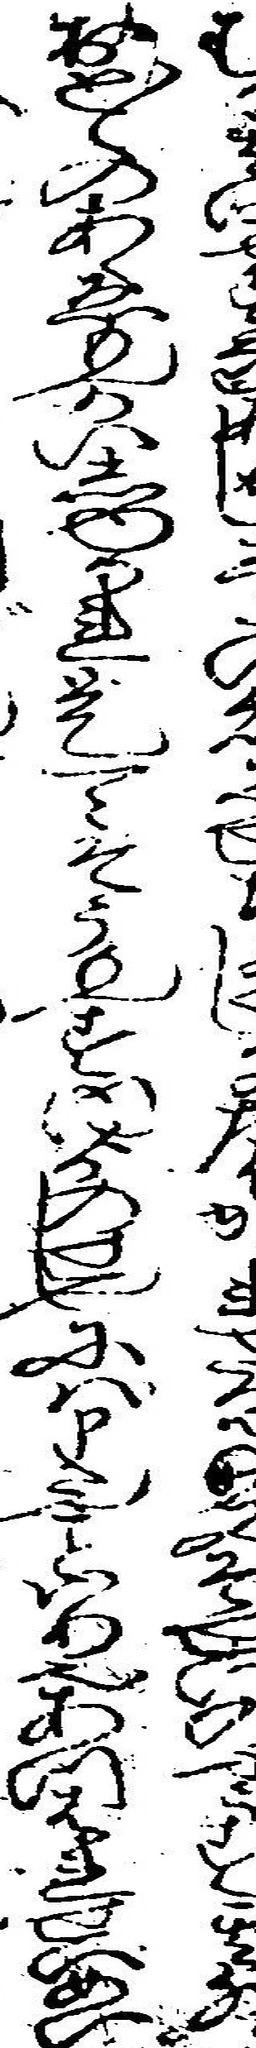おと〳〵のあくゑもんかいしゆかれ是一々そうもんす内ゟのせんしには申さんことはり也あつはれせいめい
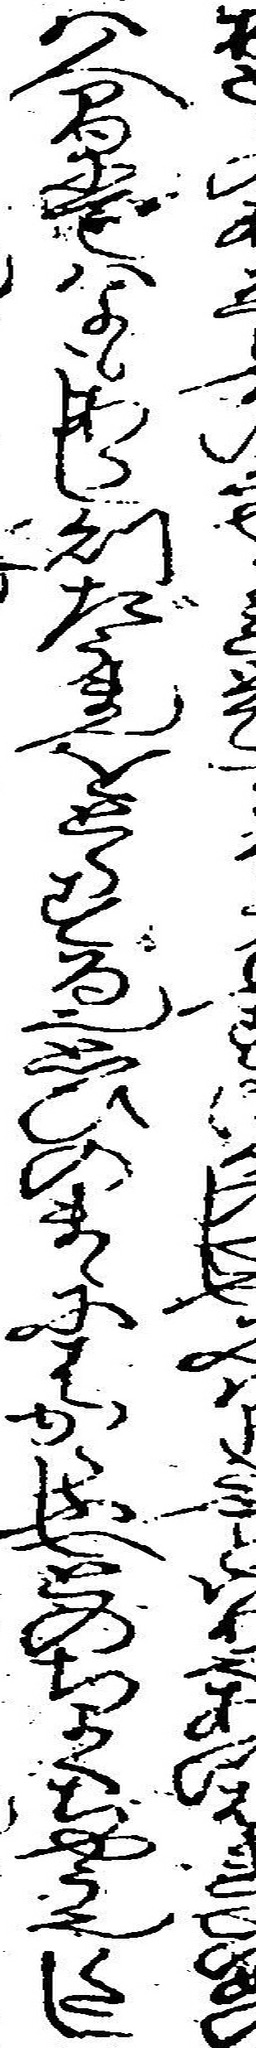は人間にてはよもあらし則だうまんをとらする也思ひのまゝにはからふへしとのしよくちやう也たし
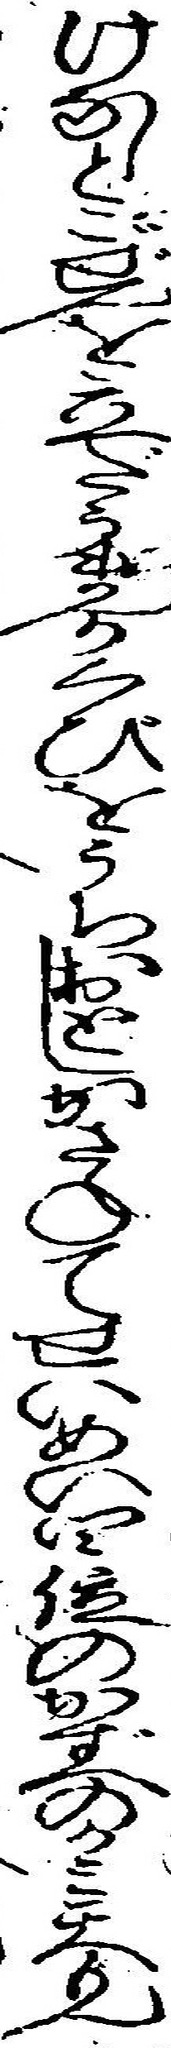けなしとごぜんを立だうまんかくびをうちおとしかさねてせいめい四位のかずへのかみ天もん
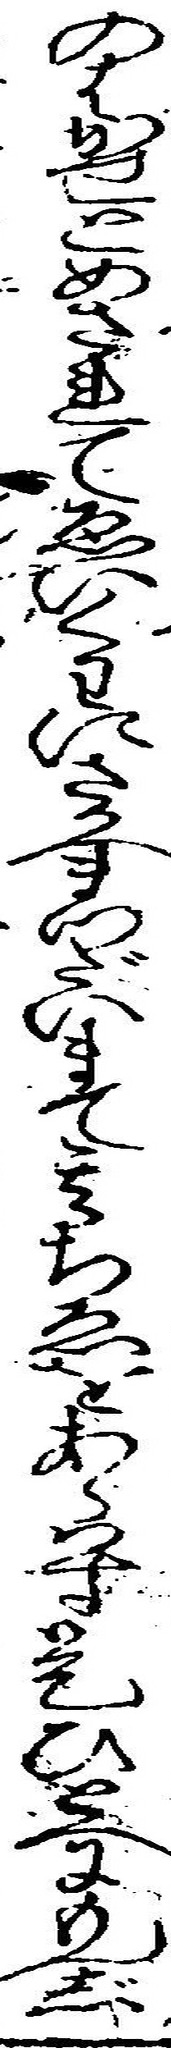のはかせとめされてゑいくわにさかへまつだいまて其ちゑをあらはす是ひとへにもんじ
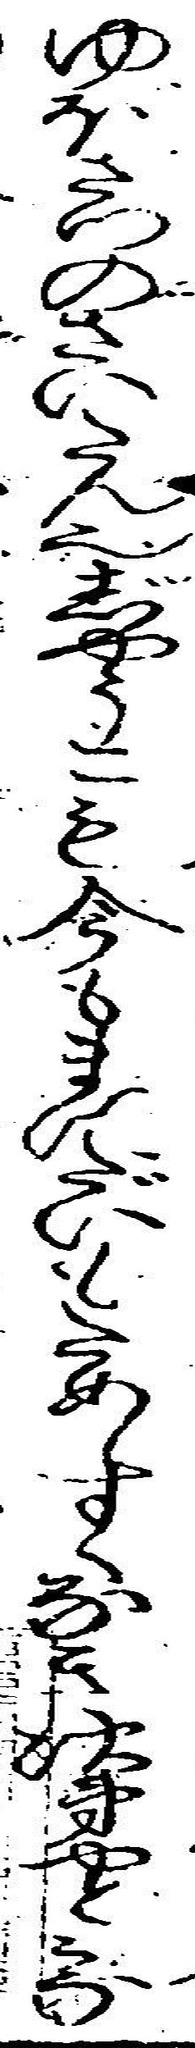ゆほさつのさいたん也じやうこも今もまつだいもためしすくなき次第やとな
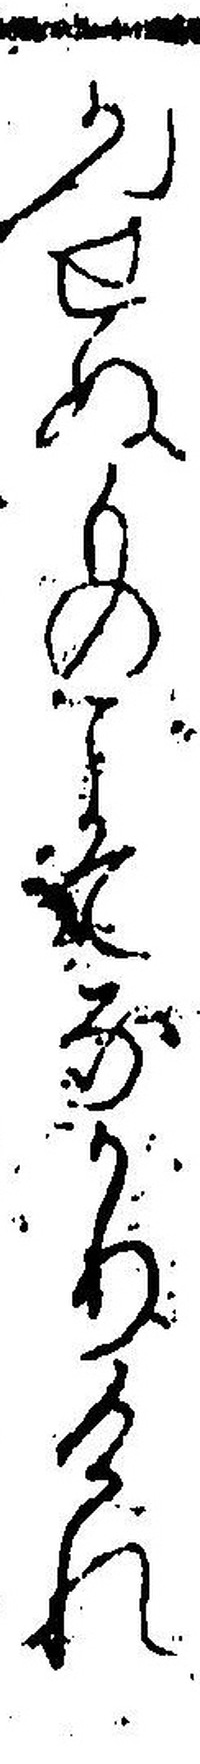かんせぬものこそなかりけれ
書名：[しのだづまつりぎつね付あべの清明出生]
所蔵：東京大学総合図書館 General Library in the University of Tokyo, JAPAN
